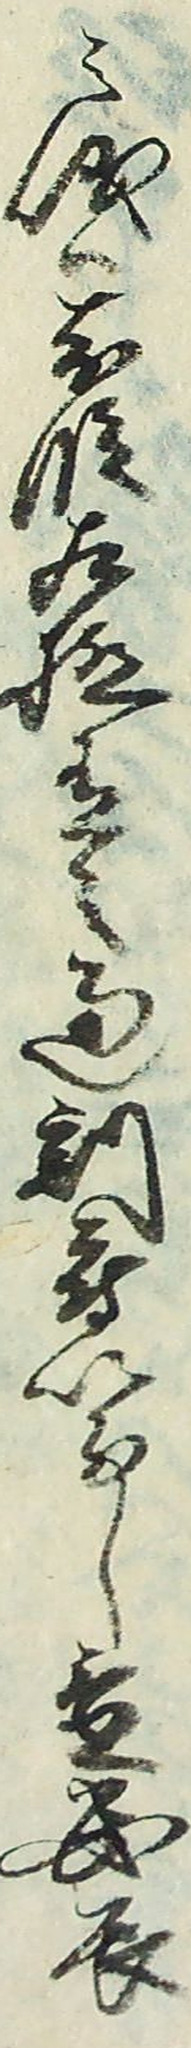の儀は前段相極有之通割符いたし置当辰
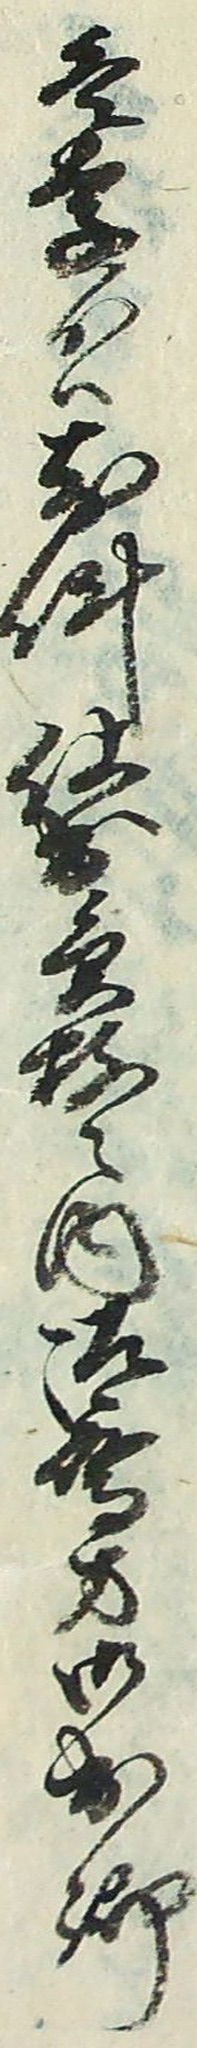冬季よりは前件仕出員数の内御鷹方御出郷
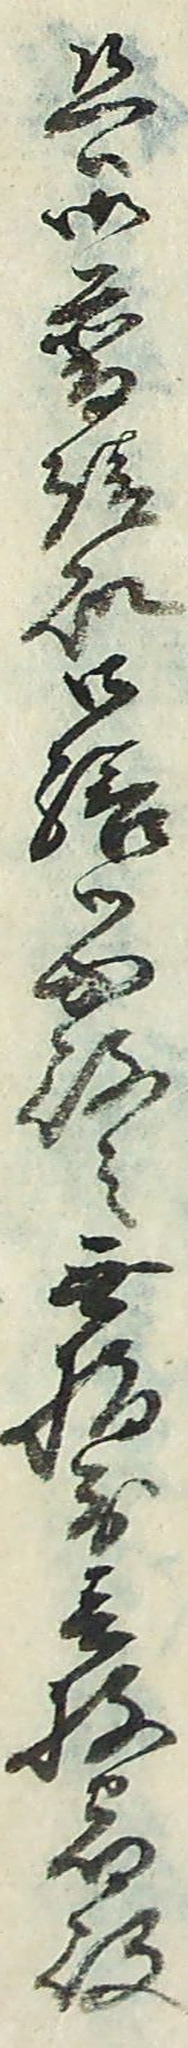且は御普請処御繕御出役の無指別一牧宿役

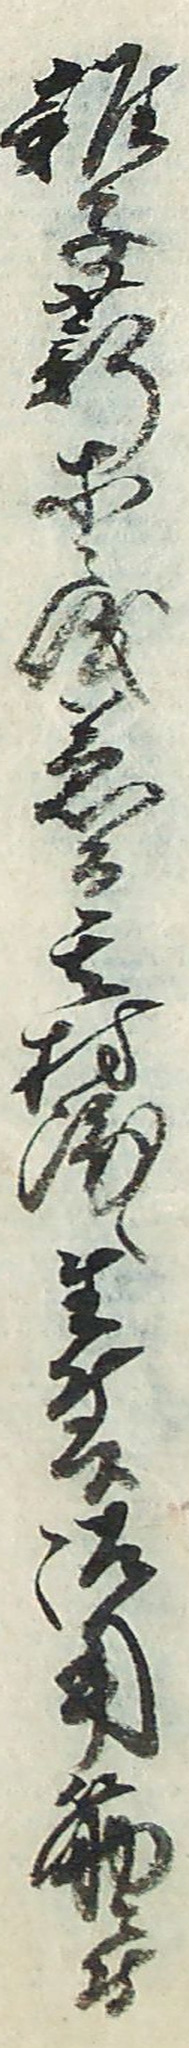雑子薪等の儀兼て其村浦へ生付候御用筋に付
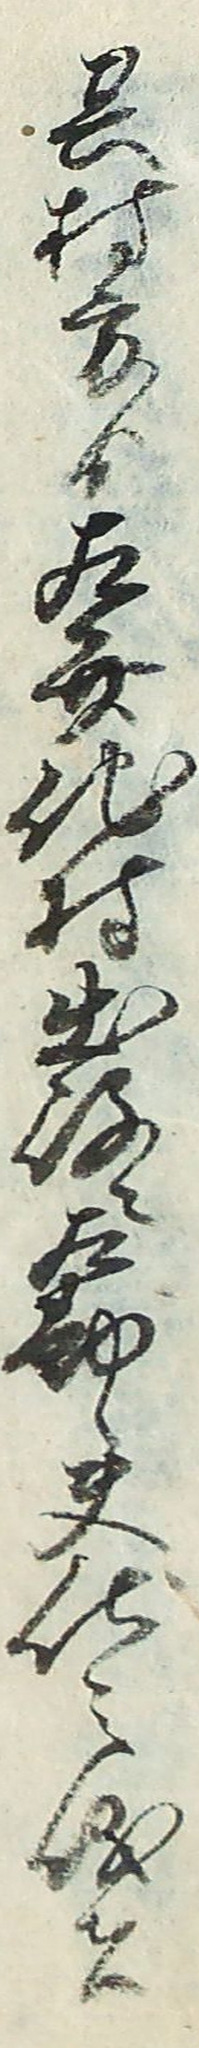其村方より相弁他村出役に相勤候夫仕の儀は
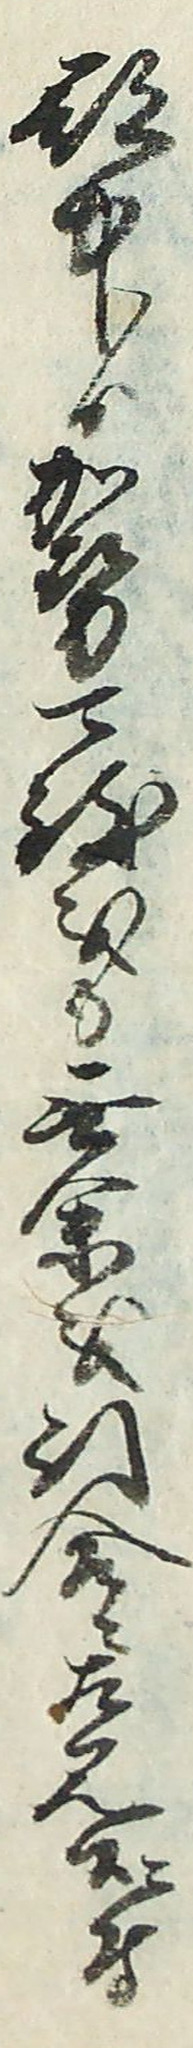郡中より加勢可致義も無余義引合に相見候に付
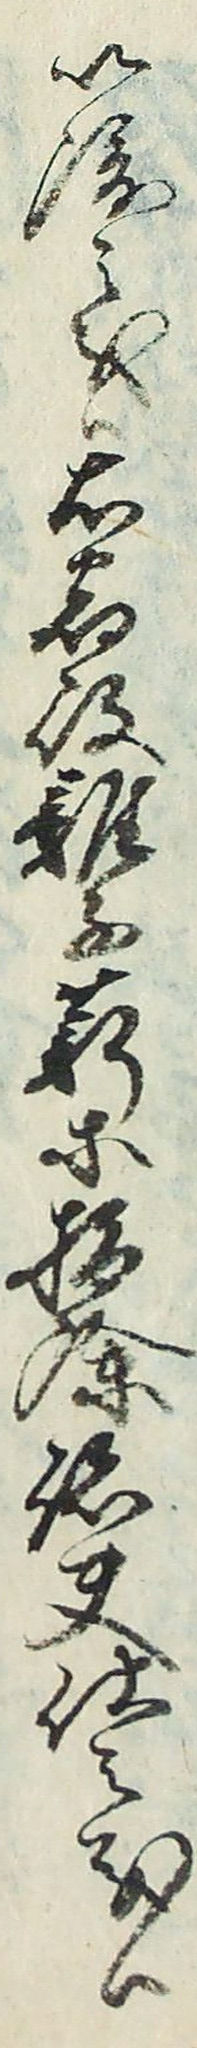以後の義は右宿役雑子薪等指除諸夫仕の義は
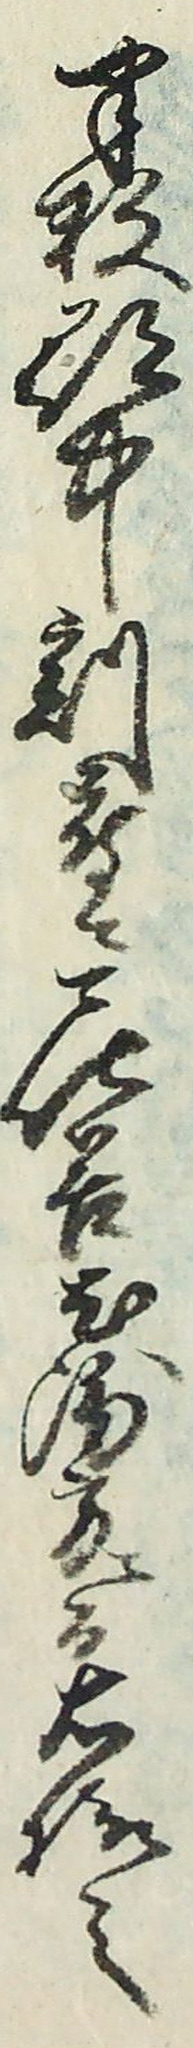半数郡中割符に可仕筈尤浦方にて右様の
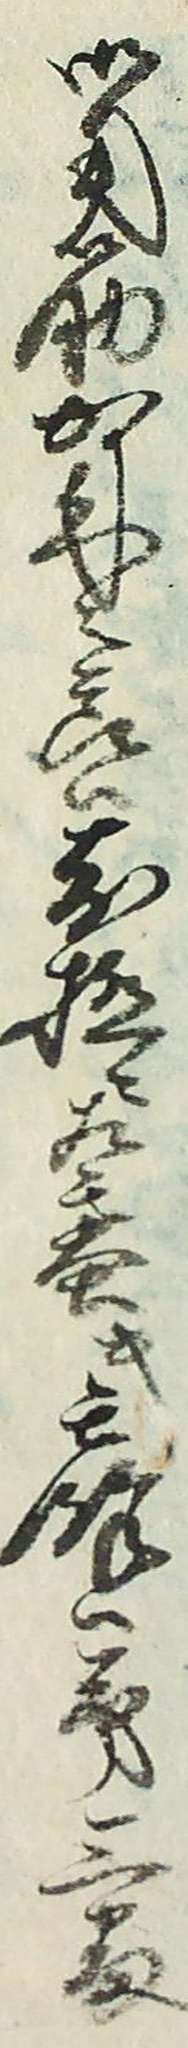御用筋出来の節は前極に相基き其余は第三番
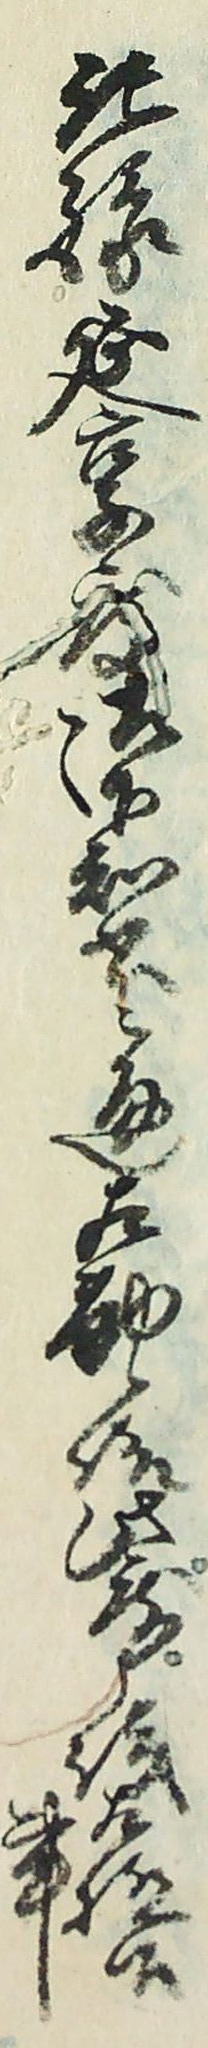記録延享度御下知書の通相勤候様此度申談相極候事
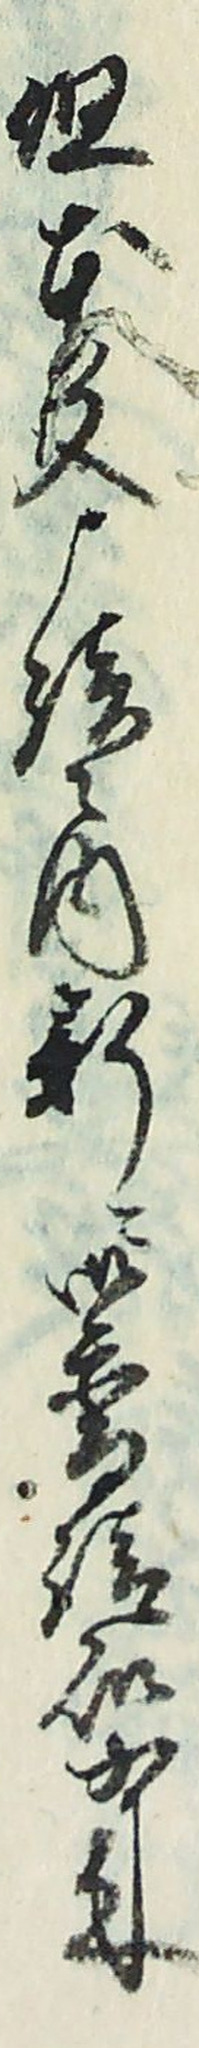但本文申談の内新に御普請処出来
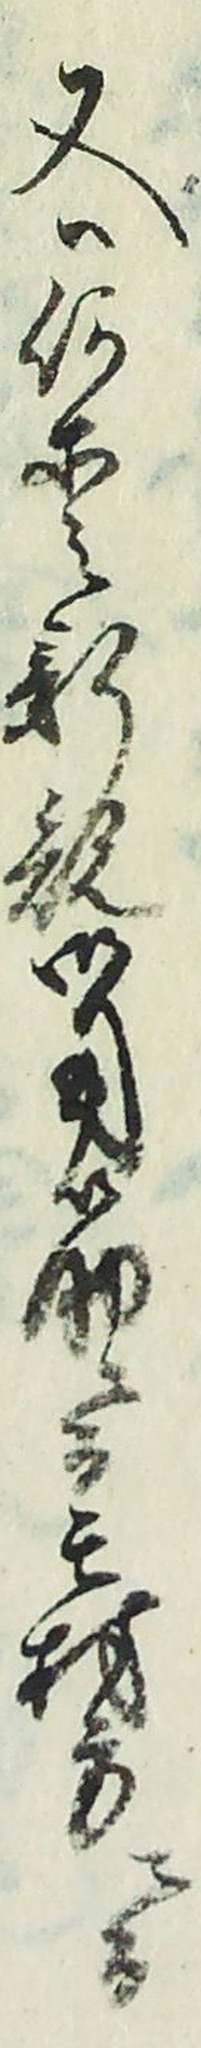又は何等の新規御用筋にて其村方にて
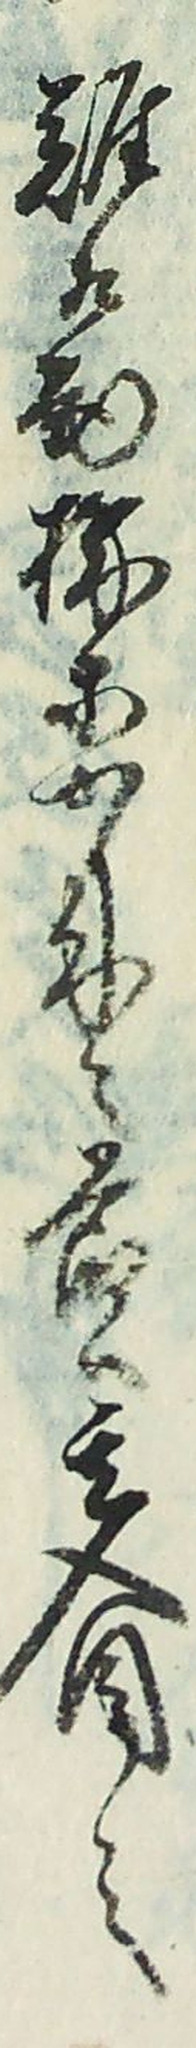難相勤株等出来の節は其入目の
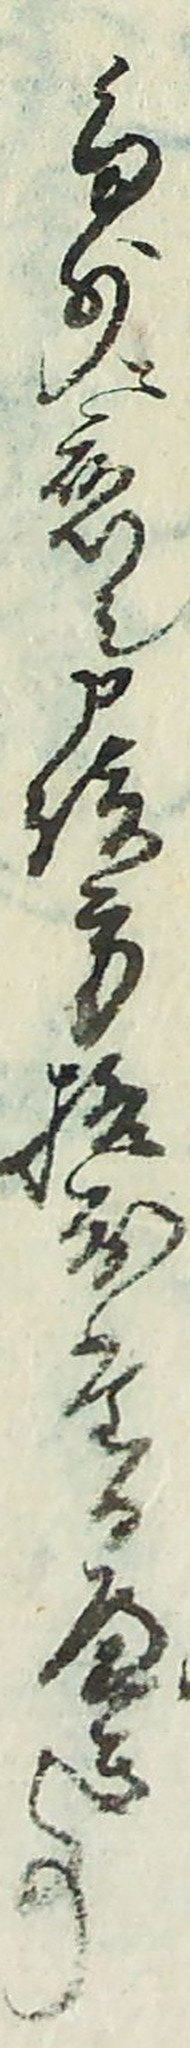多少に応し申談方十分たるへき事
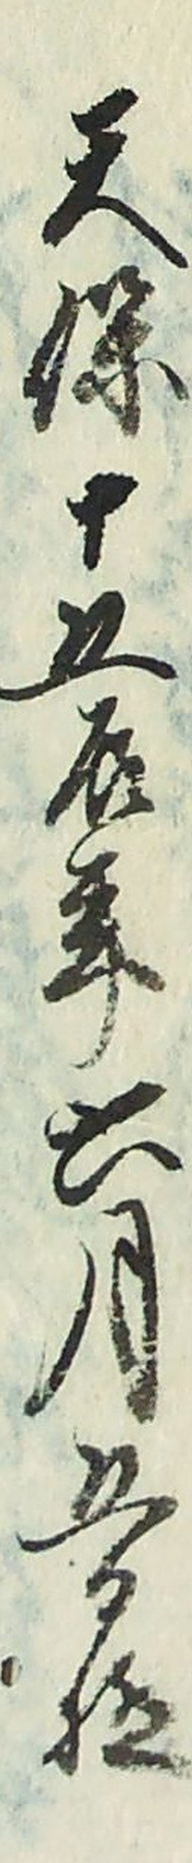天保十五辰年六月五日極
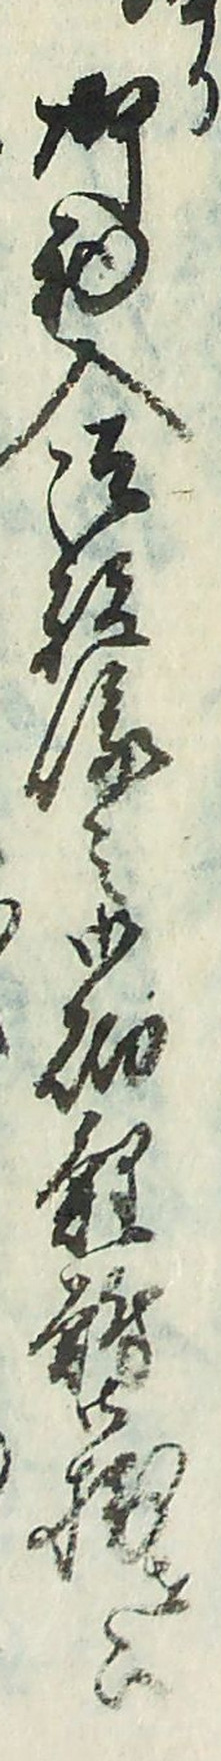御初入御祝儀の御砌鯉鮒御捌を被
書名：諸割賦物賃銀定記録帳
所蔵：鳴門教育大学 Naruto University of Education
